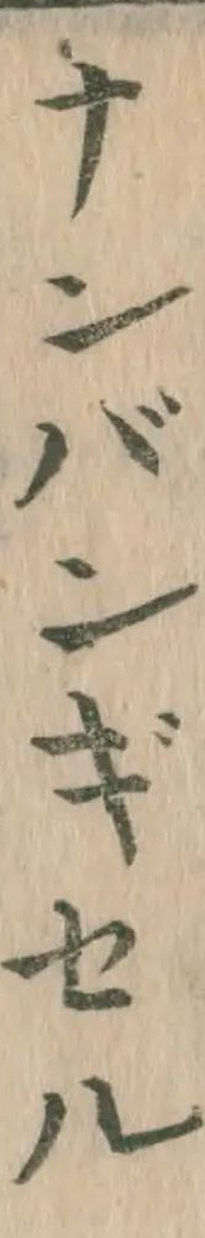ナンバンギセル
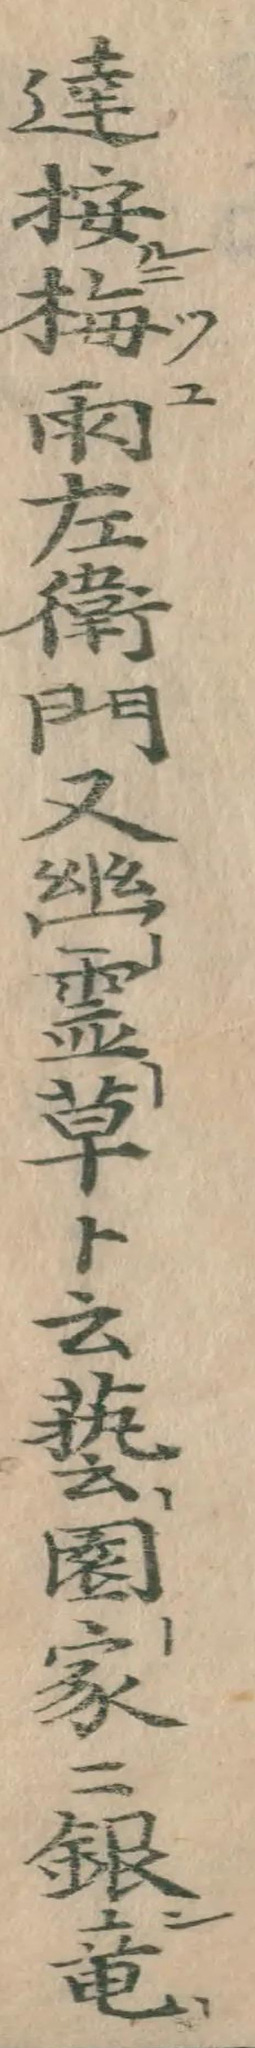達按梅雨左衛門又幽霊草ト云芸園家ニ銀竜
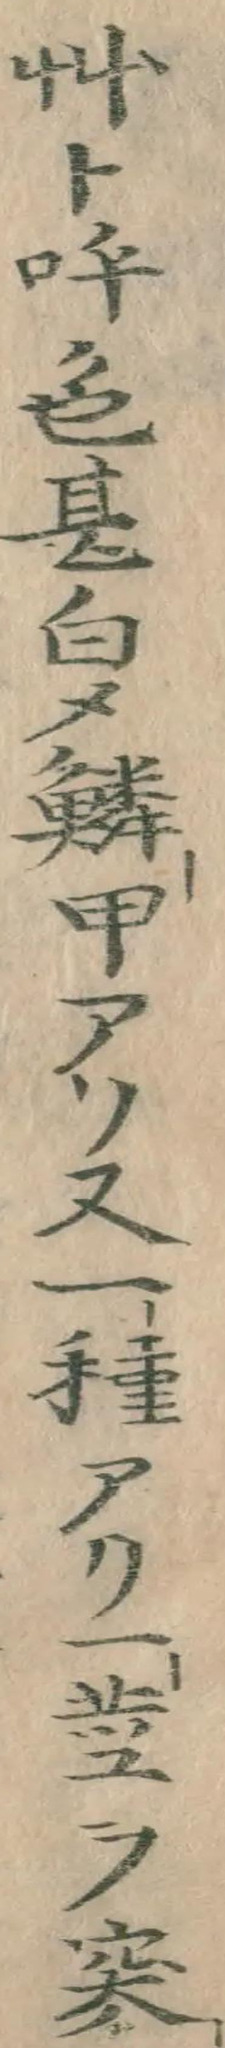艸ト呼色甚白シテ鱗甲アリ又一種アリ一茎ヲ突
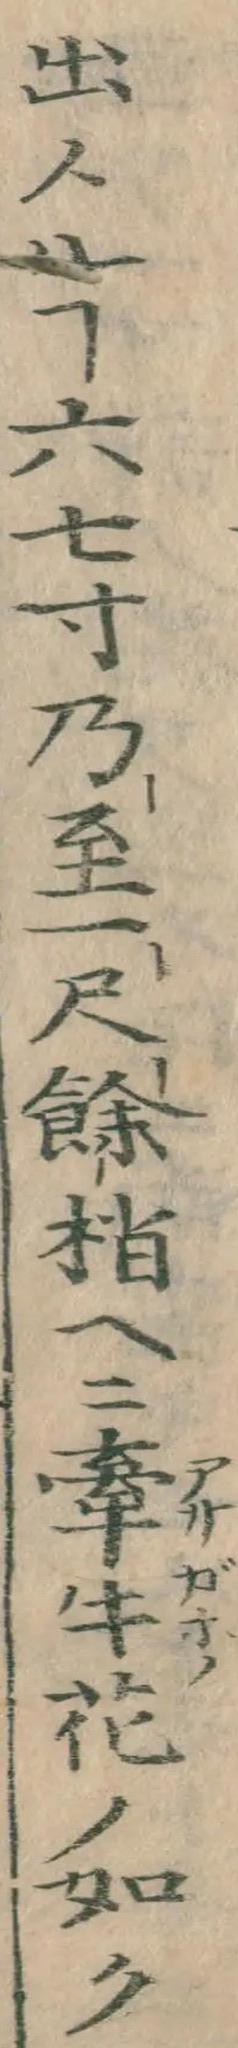出スルコト六七寸乃至一尺余梢ヘニ牽牛花ノ如ク

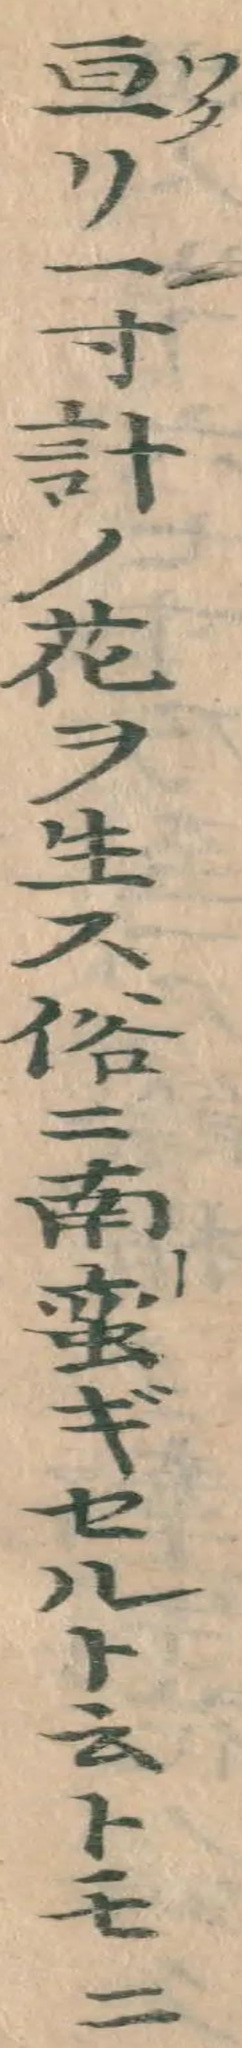亘リ一寸許ノ花ヲ生ス俗ニ南蛮ギセルト云トモニ
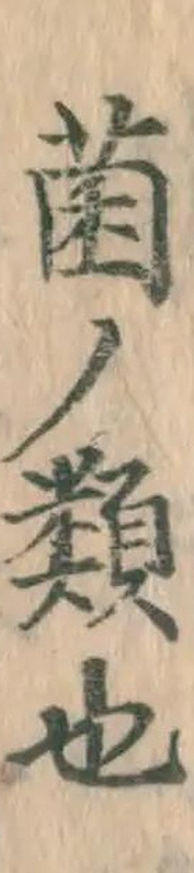菌ノ類也
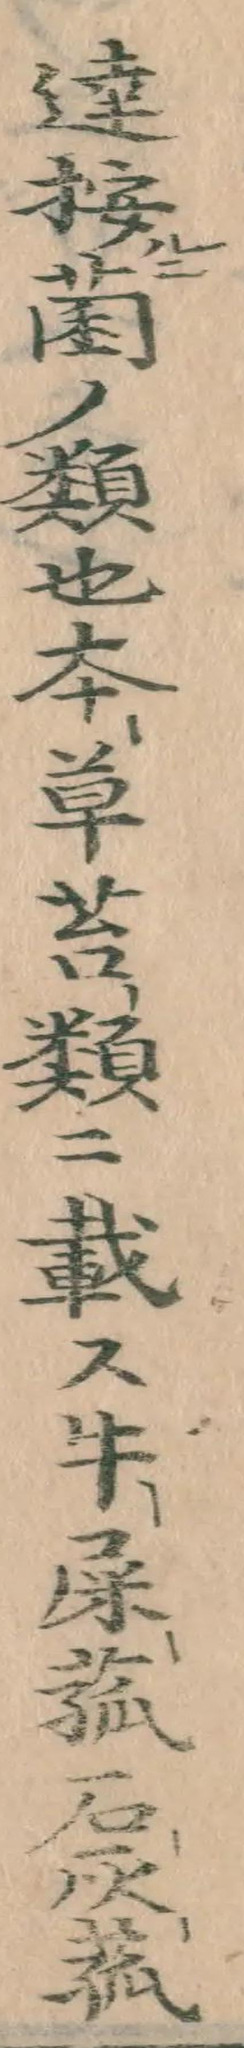達按菌ノ類也本草苔類ニ載ス牛屎菰石灰菰
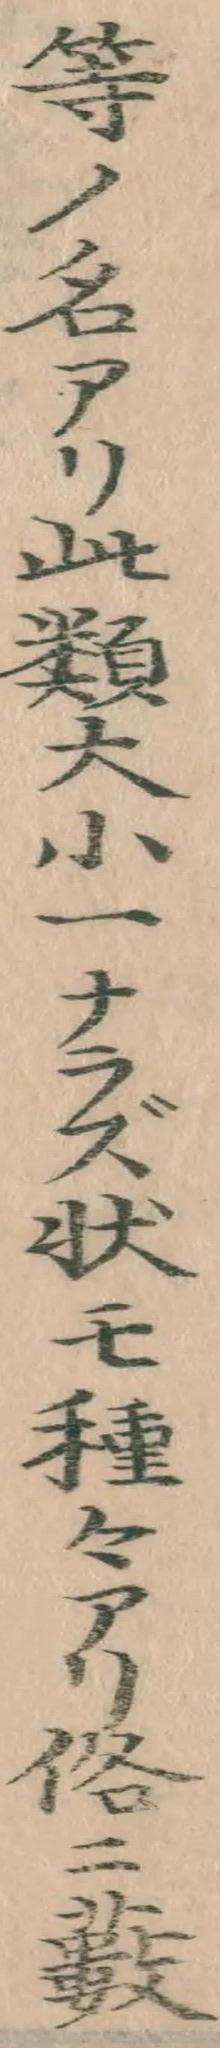等ノ名アリ此類大小一ナラズ状モ種々アリ俗ニ藪
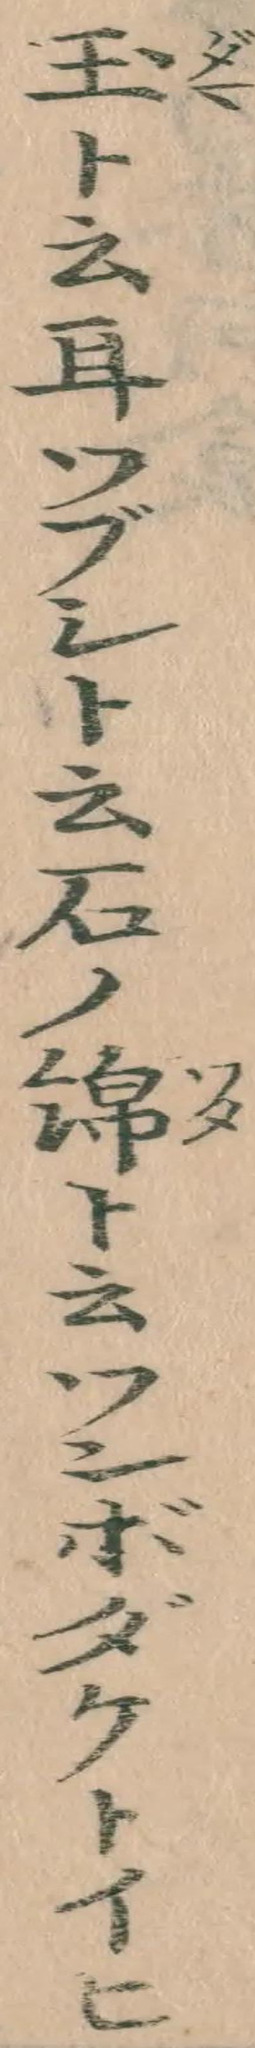玉ト云耳ツブシト云石ノ綿ト云ツンボダケトイヒ
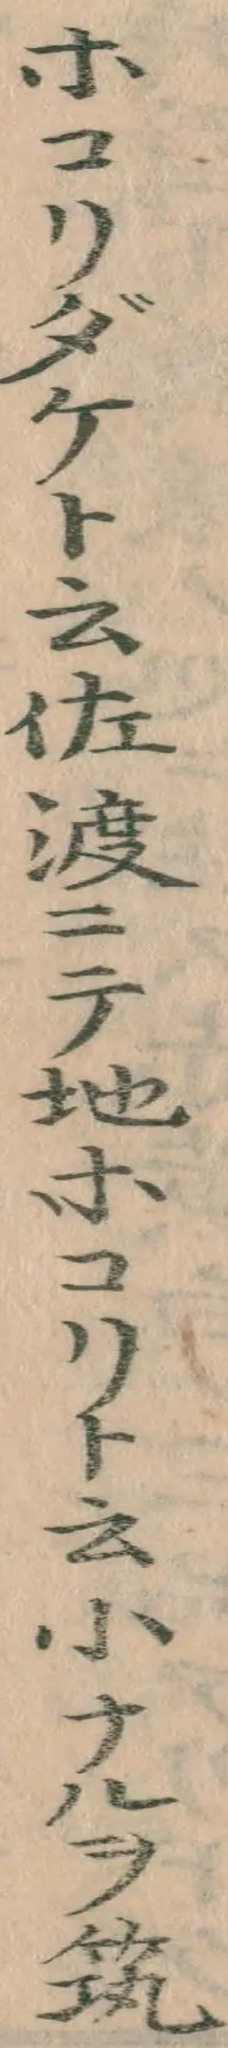ホコリダケト云佐渡ニテ地ホコリト云小ナルヲ筑
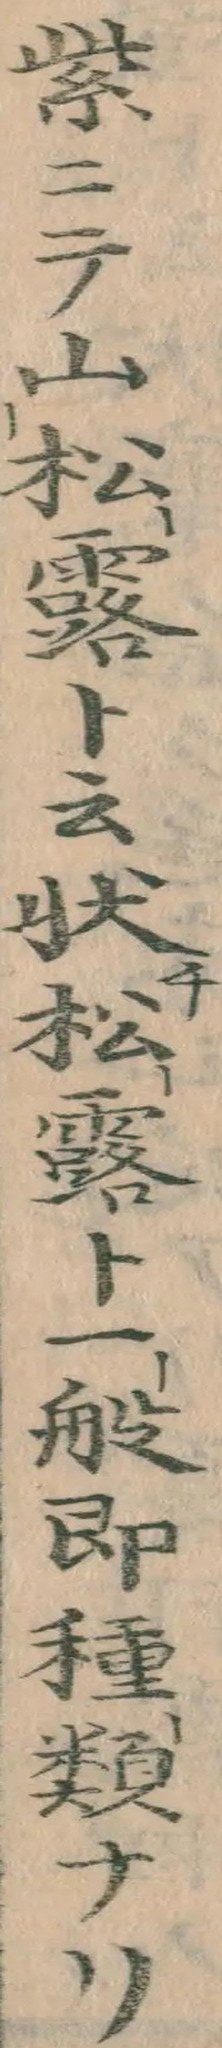紫ニテ山松露ト云状松露ト一般即種類ナリ
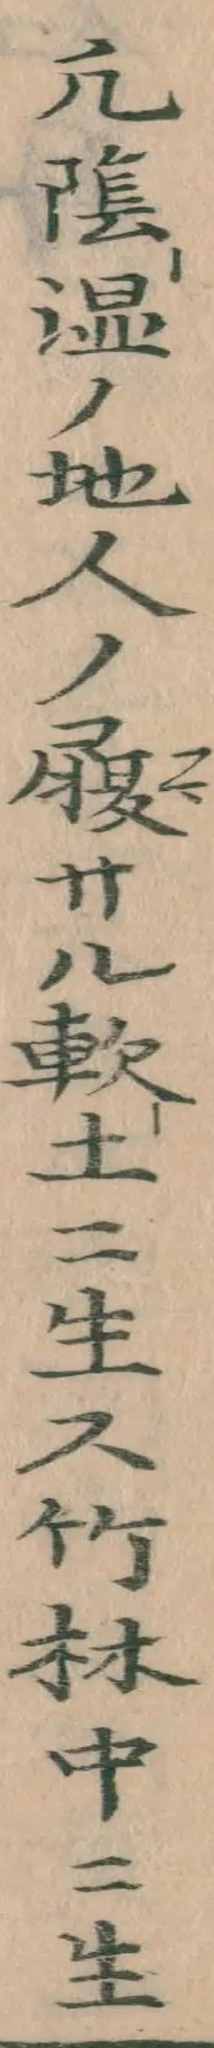凡陰湿ノ地人ノ履サル軟土ニ生ス竹林中ニ生
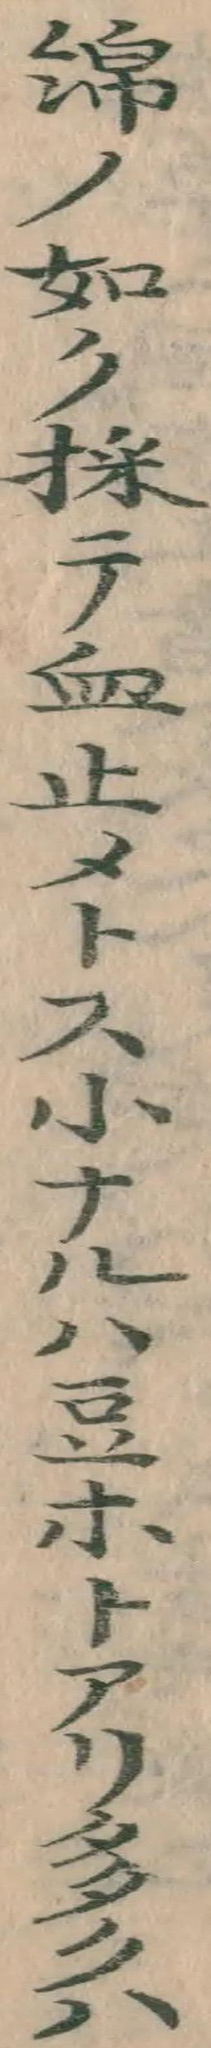綿ノ如ク採テ血止メトス小ナルハ豆ホトアリ多クハ
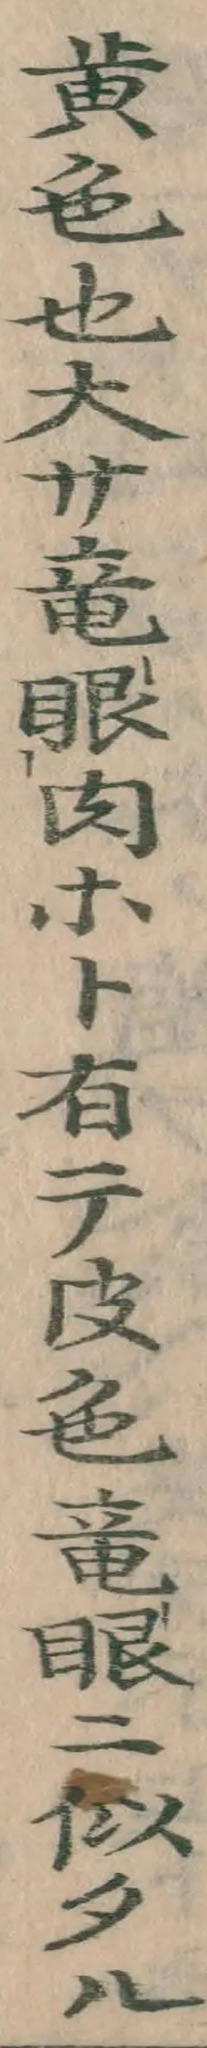黄色也大サ竜眼肉ホト有テ皮色竜眼ニ似タル
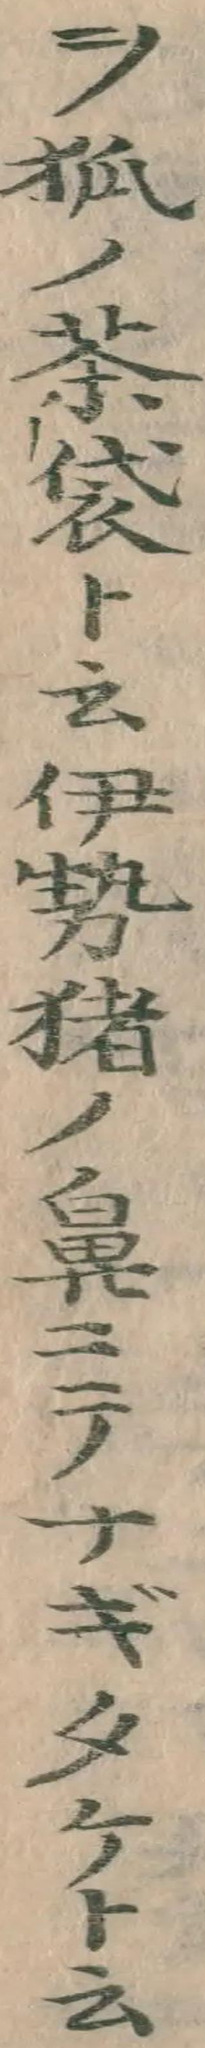ヲ狐ノ茶袋ト云伊勢猪ノ鼻ニテナギタケト云
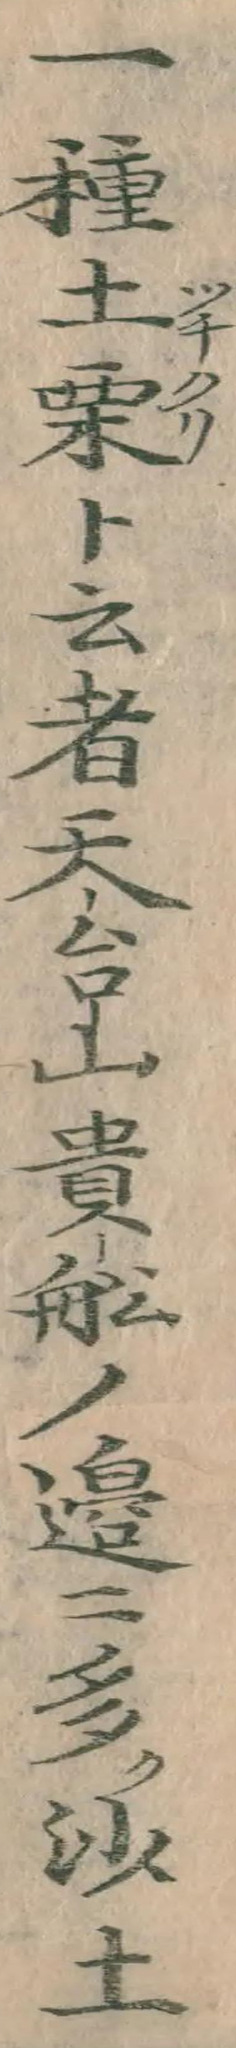一種土栗ト云者天台山貴船ノ辺ニ多沙土
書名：怡顔斎菌品 2巻
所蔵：国立国会図書館 National Diet Library, JAPAN
